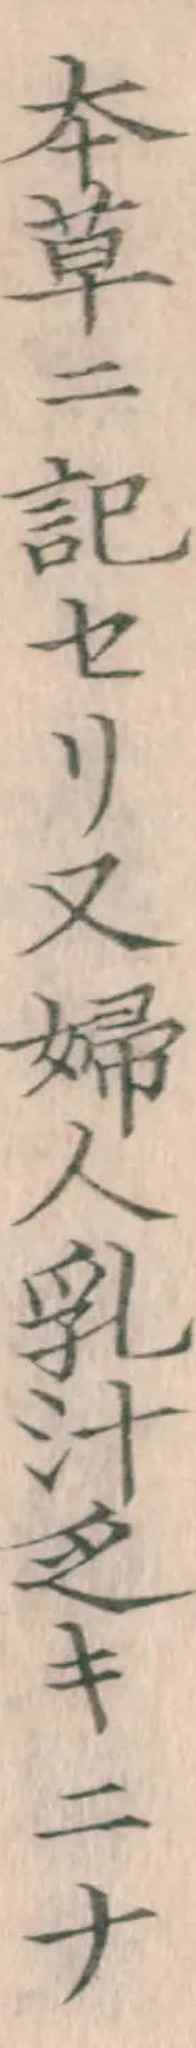本草ニ記セリ又婦人乳汁乏キニナ
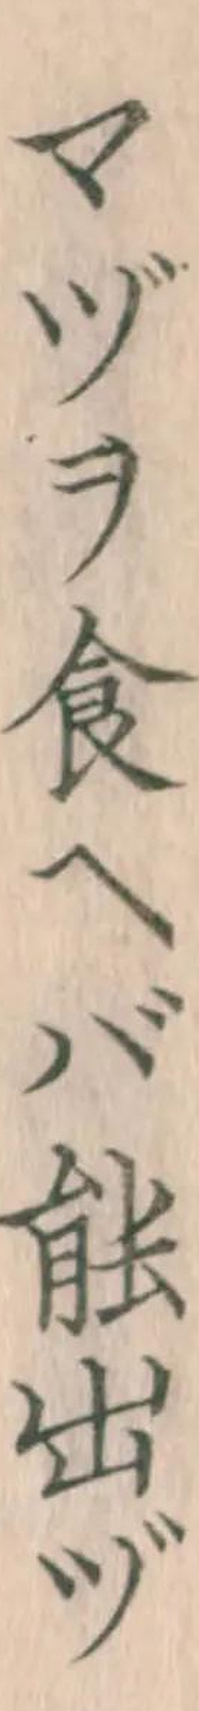マヅヲ食ヘバ能出ヅ

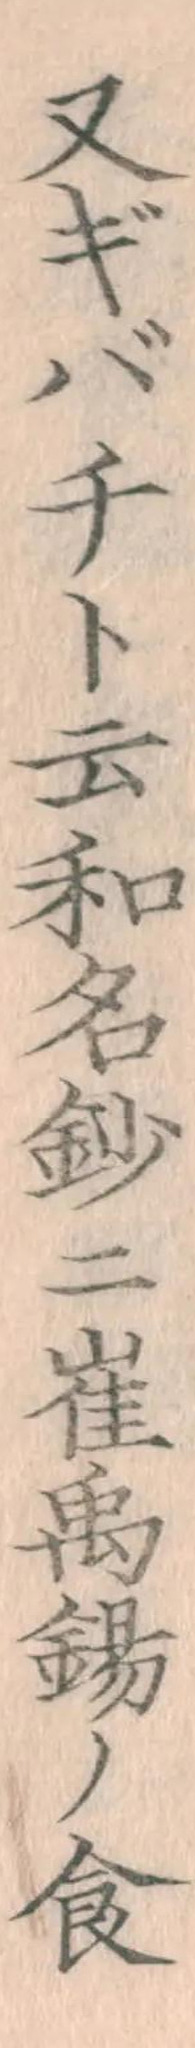又ギバチト云和名鈔ニ崔禹錫ノ食
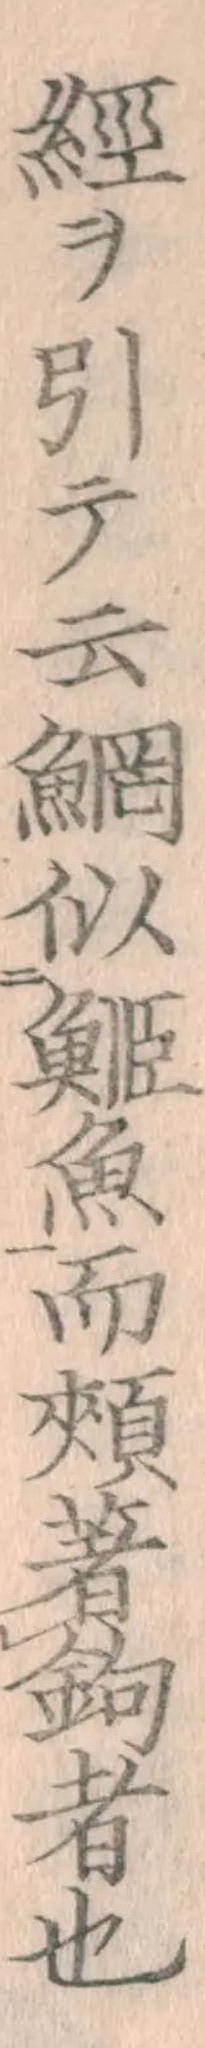経ヲ引テ云䱩似魚而頰著鉤者也
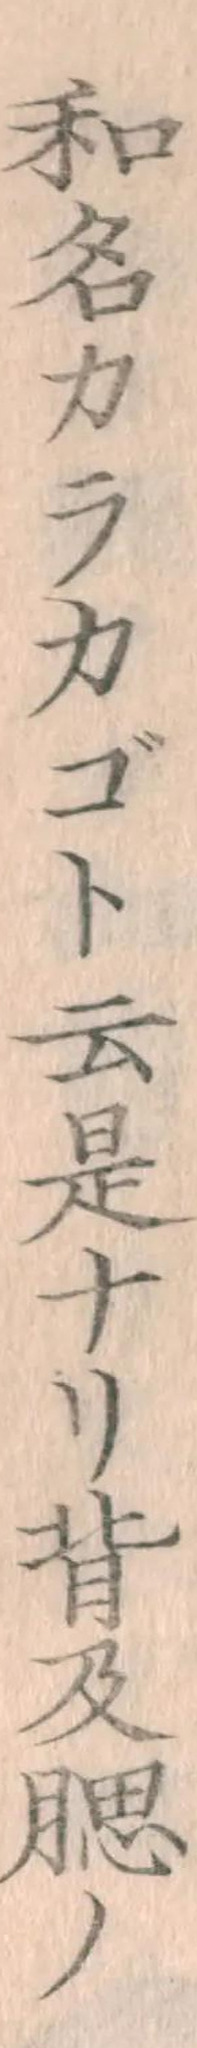和名カラカゴト云是ナリ背及腮ノ
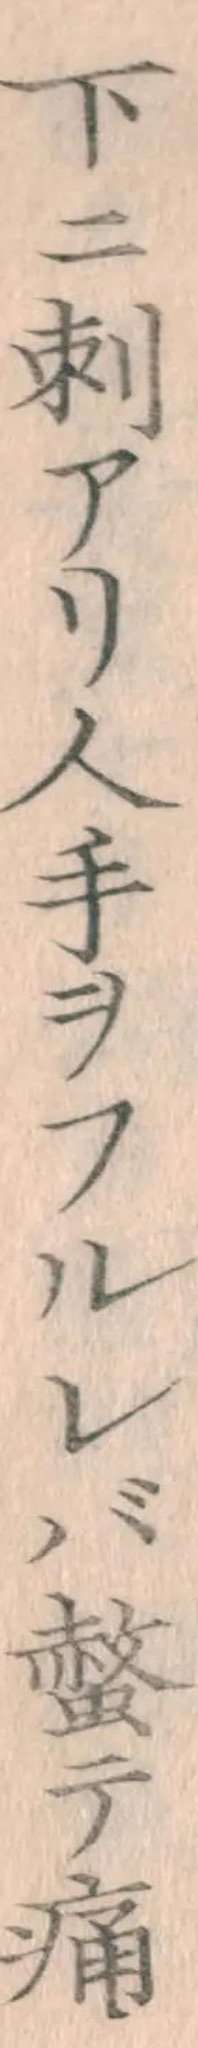下ニ刺アリ人手ヲフルレバ螫テ痛
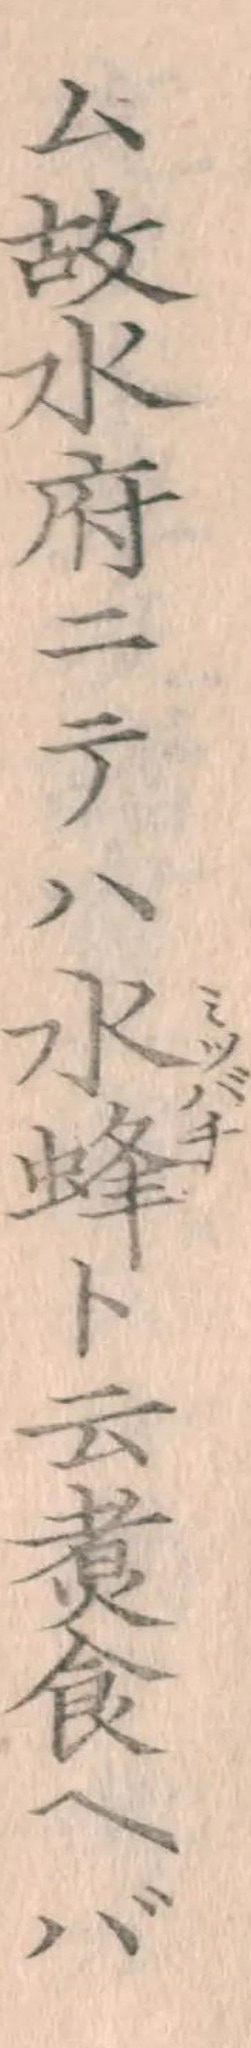ム故水府ニテハ水蜂ト云煮食ヘバ
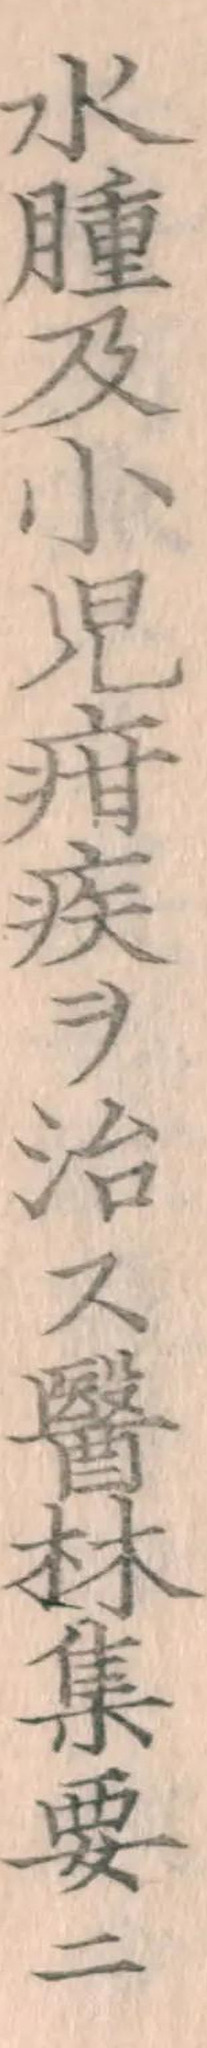水腫及小児疳疾ヲ治ス医林集要ニ
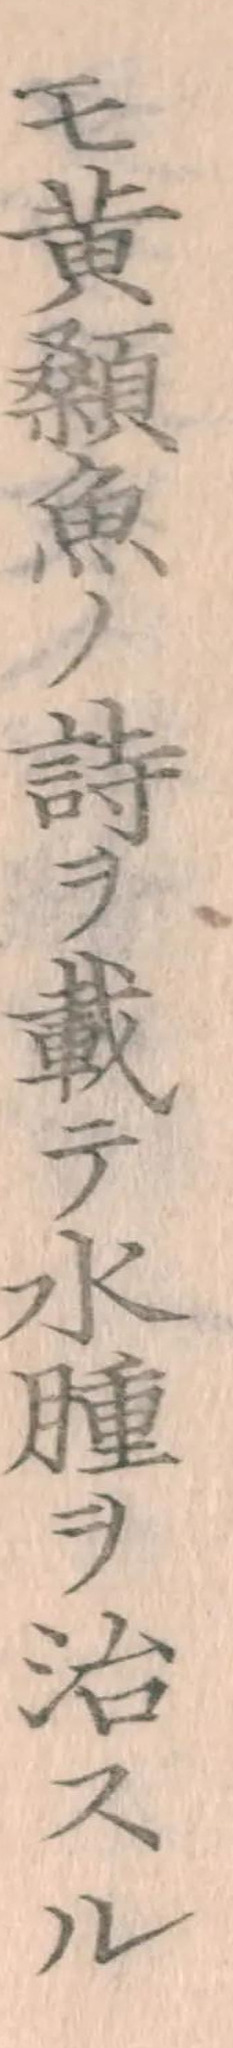モ黄顙魚ノ詩ヲ載テ水腫ヲ治スル
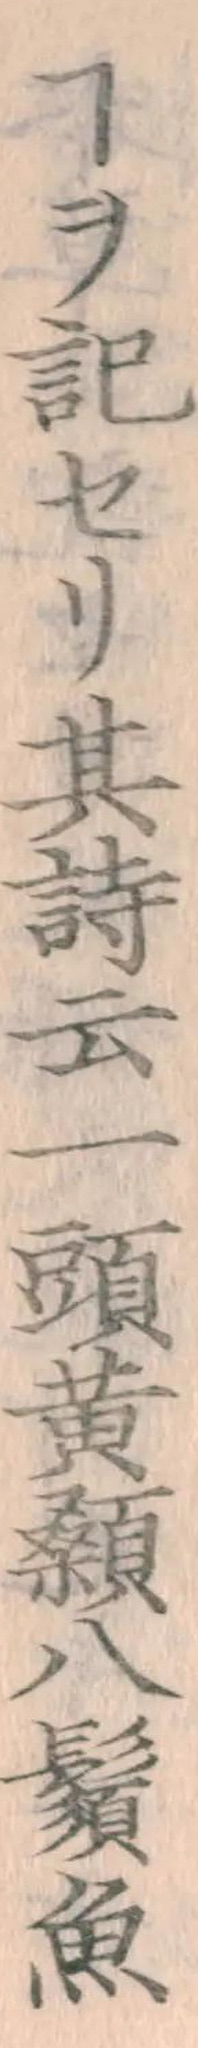ヿヲ記セリ其詩云一頭黄顙八鬚魚
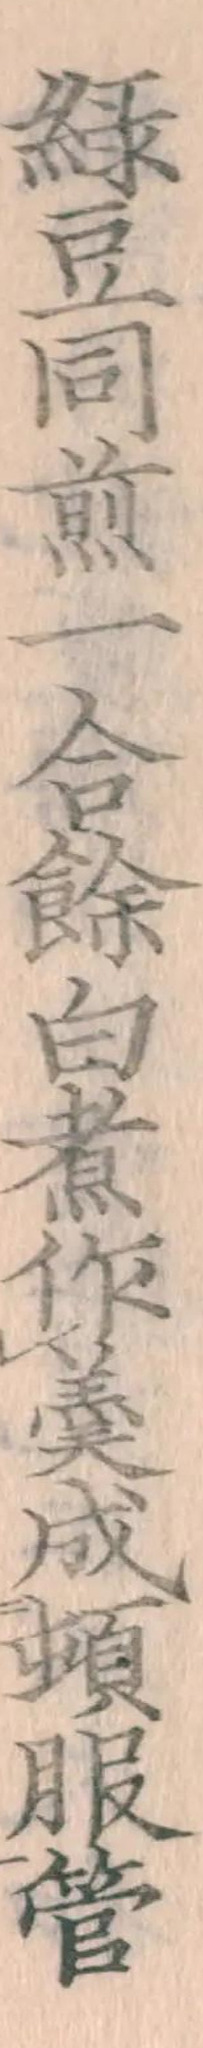緑豆同煎一合余白煮作羹成頓服管
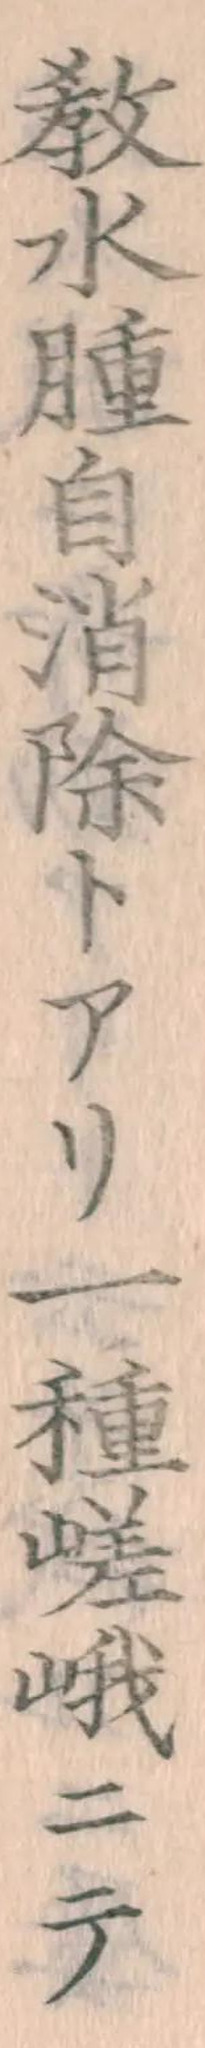教水腫自消除トアリ一種嵯峨ニテ
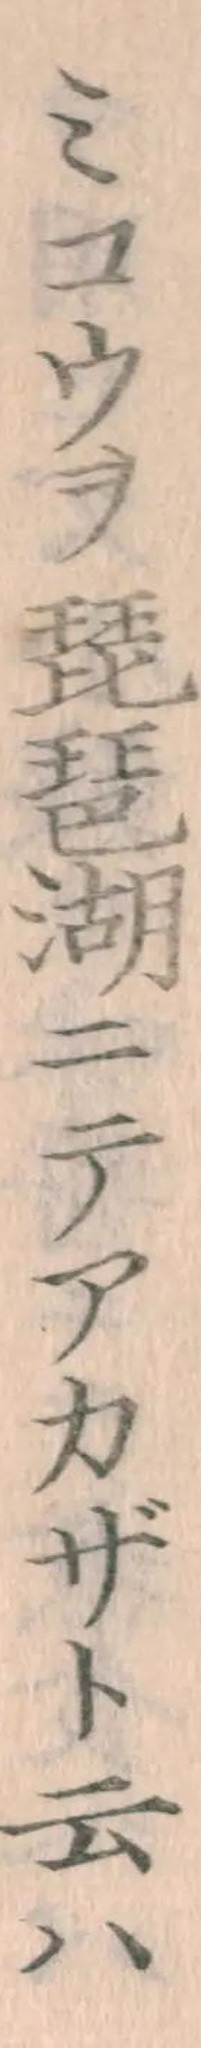ミコウヲ琵琶湖ニテアカザト云ハ
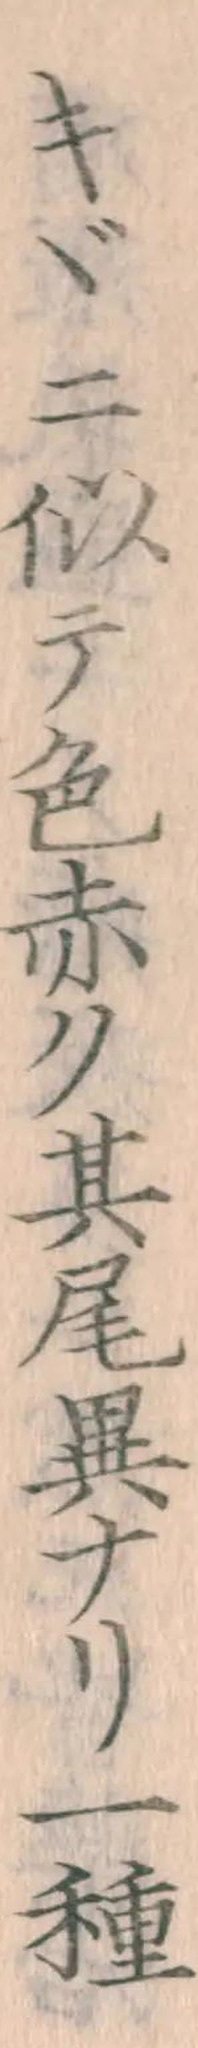キヾニ似テ色赤ク其尾異ナリ一種
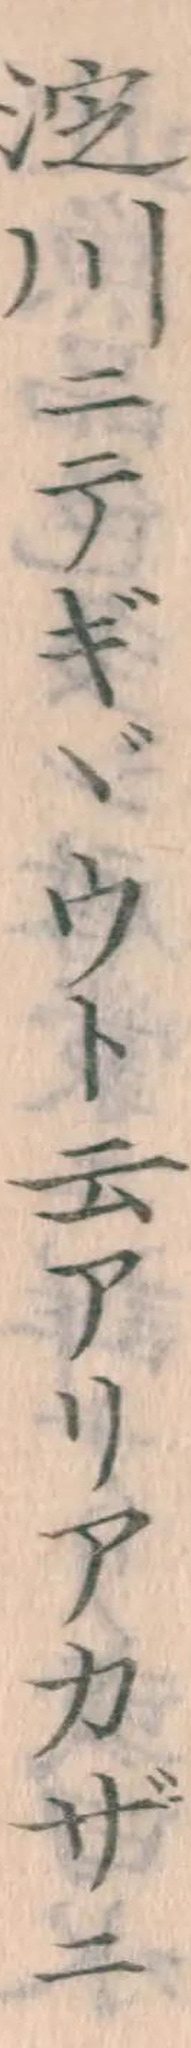淀川ニテギヾウト云アリアカザニ
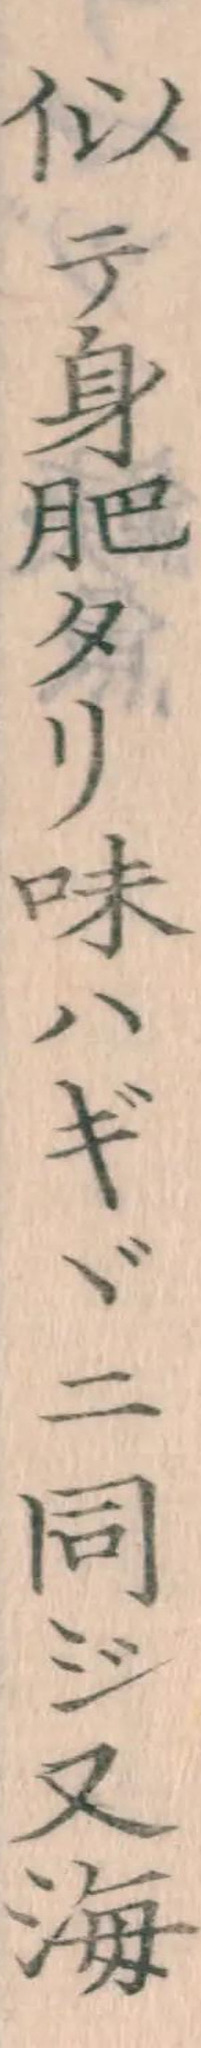似テ身肥タリ味ハギヾニ同ジ又海
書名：皇和魚譜 2巻
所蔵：国立国会図書館 National Diet Library, JAPAN
